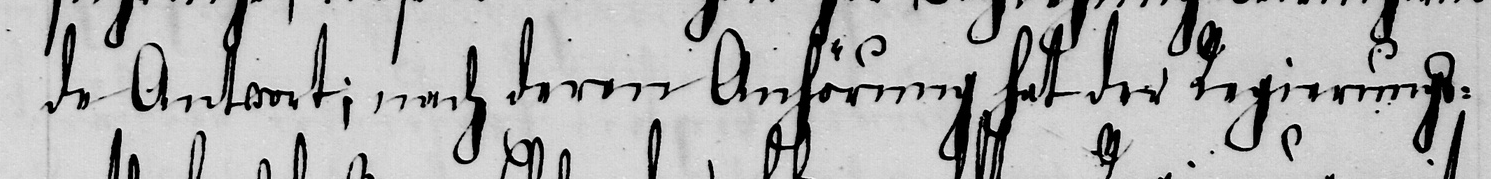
de Antwort; nach deren Anhörung hat der Regierungs¬
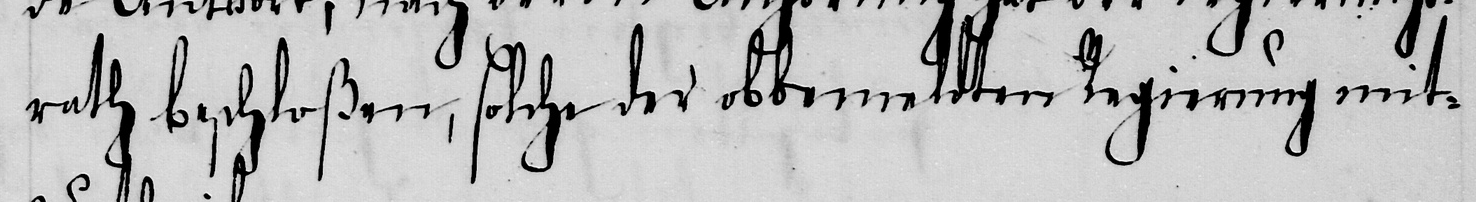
rath beschloßen, solche der obbemeldten Regierung mit¬
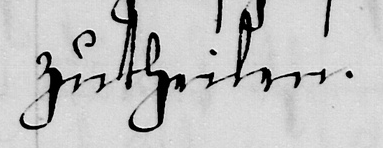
zutheilen.
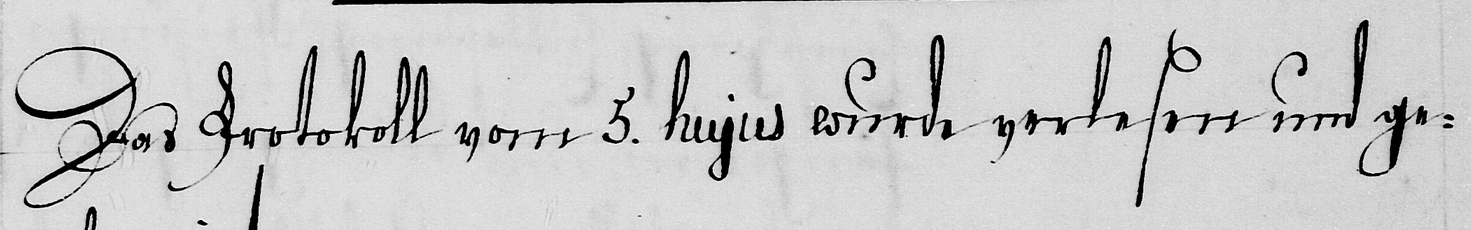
Das Protokoll vom 5. hujus wurde verlesen und ge¬
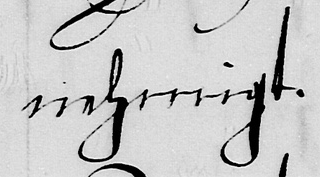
nehmigt.
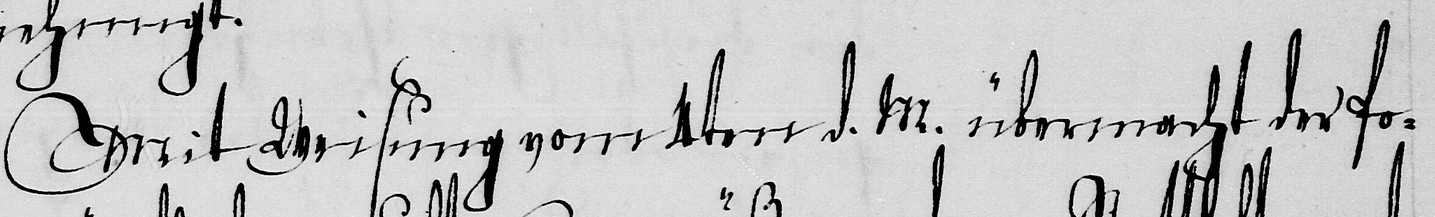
Mit Weisung vom 4ten d. M. übermacht der Po¬
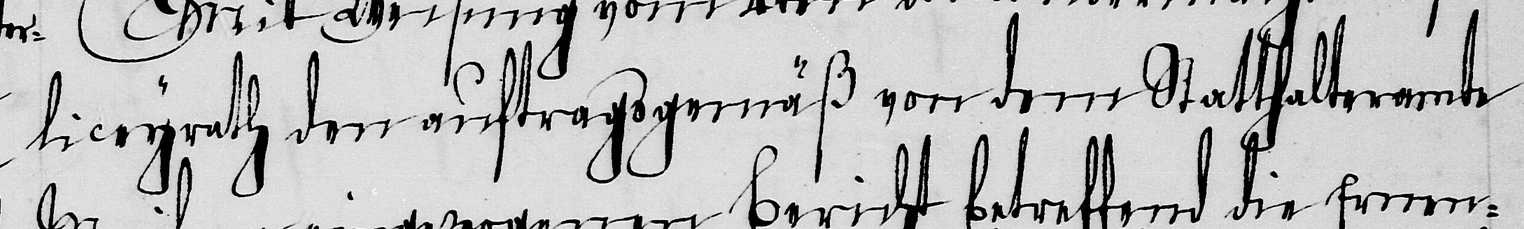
liceyrath den auftragsgemäß von dem Statthalteramte
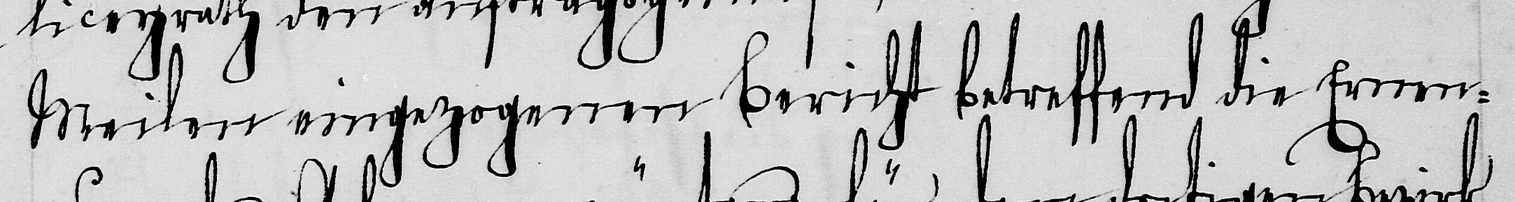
Meilen eingezogenen Bericht betreffend die Erneue¬
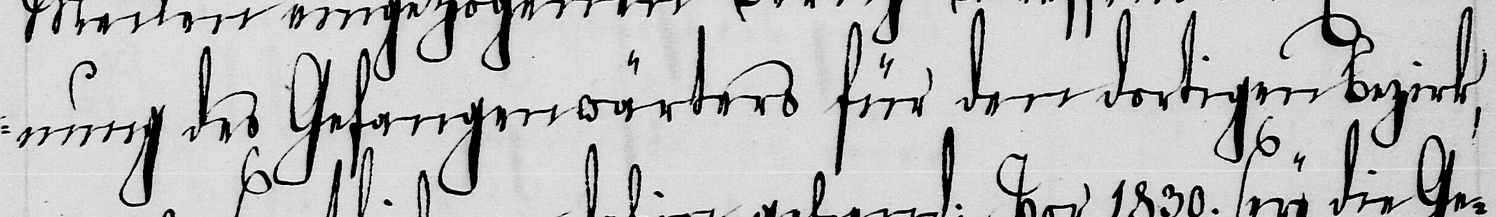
rung des Gefangenwärters für den dortigen Bezirk,
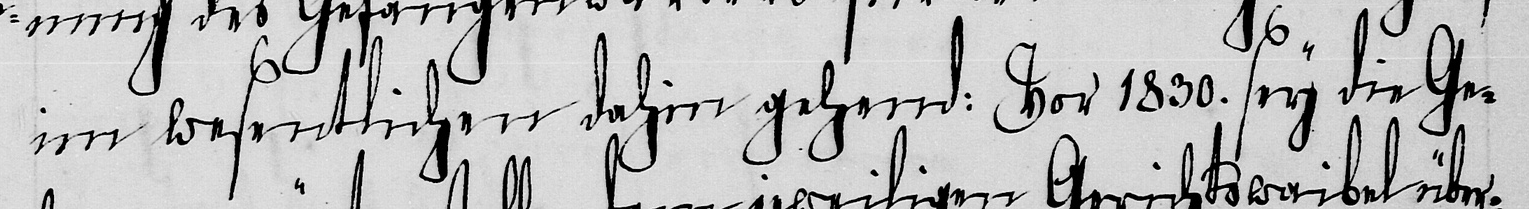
im wesentlichen dahin gehend: Vor 1830. sey die Ge¬
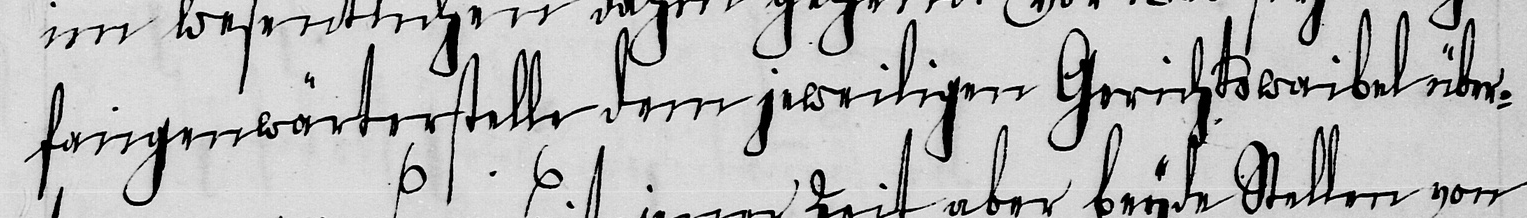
fangenwärterstelle dem jeweiligen Gerichtswaibel über¬
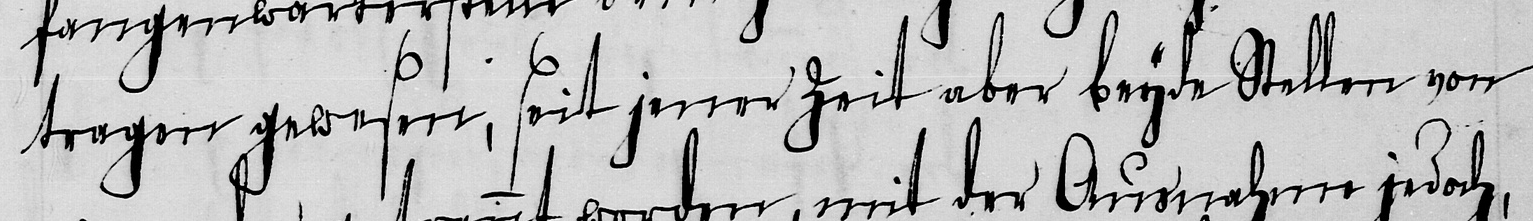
tragen gewesen, seit jener Zeit aber beyde Stellen von
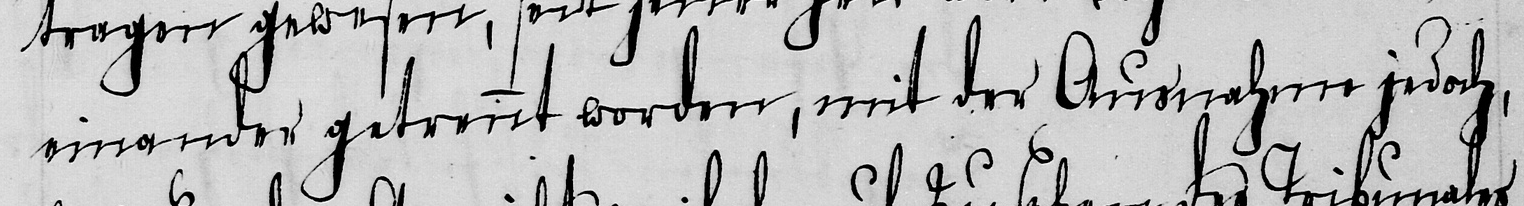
einander getrennt worden, mit der Ausnahme jedoch,
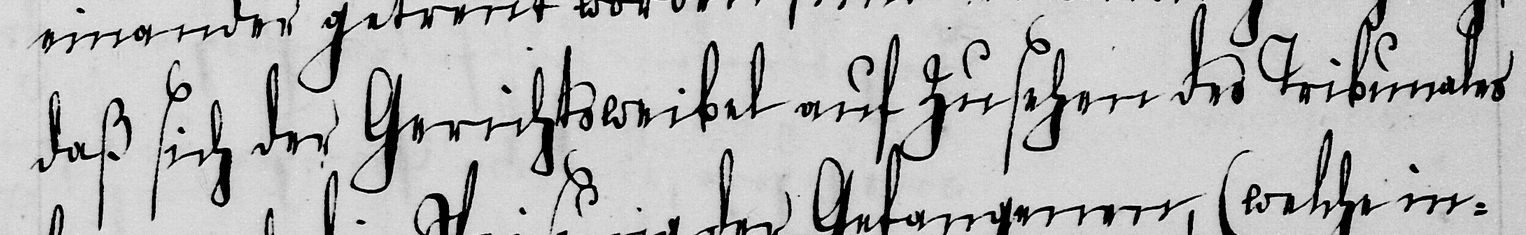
daß sich der Gerichtsweibel auf Zusehen des Tribunales
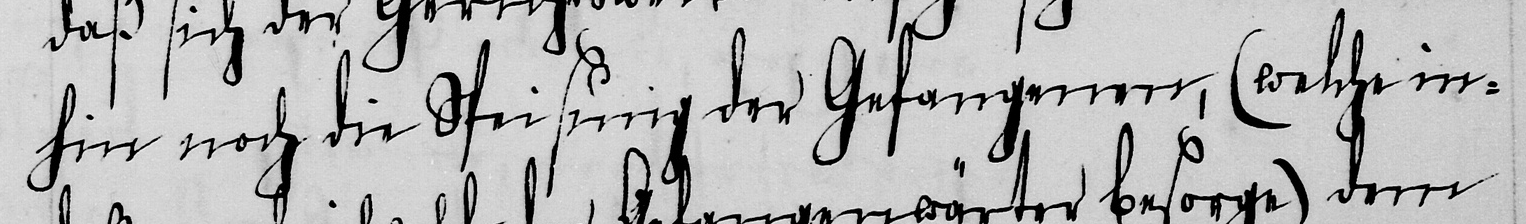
hin noch die Speisung der Gefangenen, (welche in¬
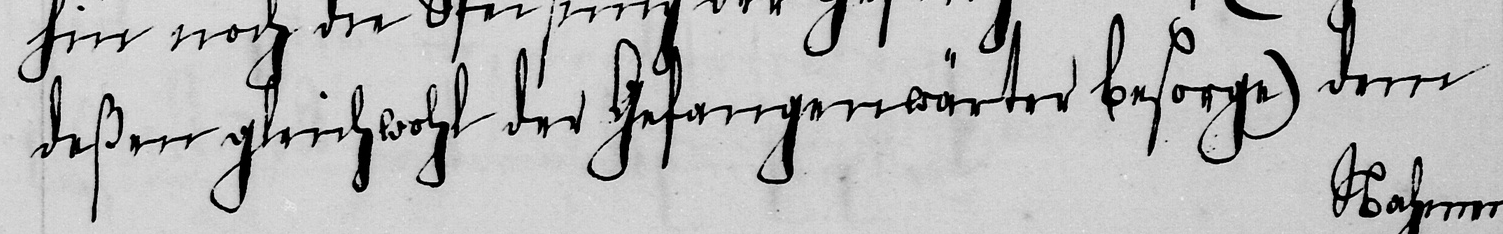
deßen gleichwohl der Gefangenwärter besorge) dem
